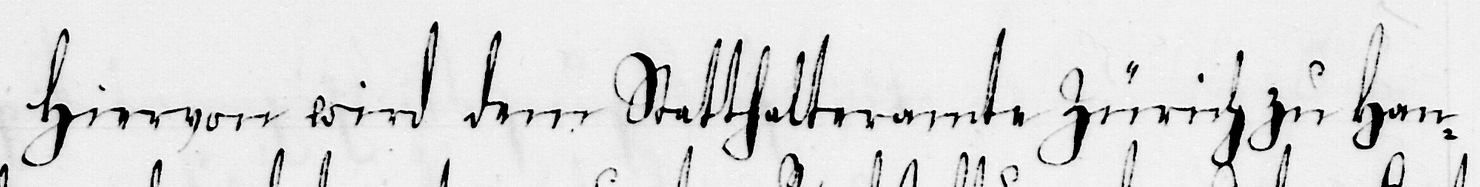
Hiervon wird dem Statthalteramte Zürich zu Han¬
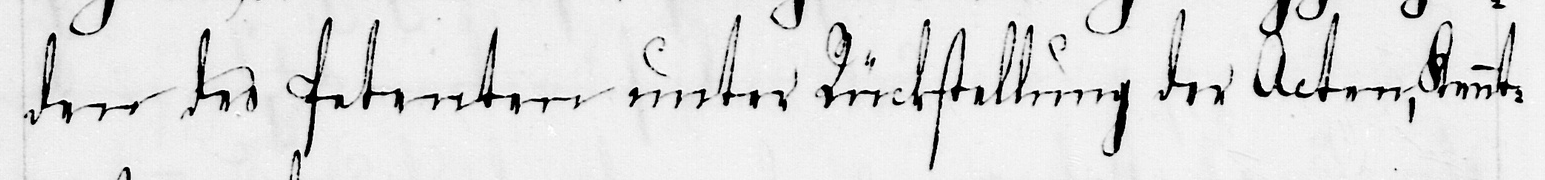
den des Petenten unter Rückstellung der Acten, Ken¬
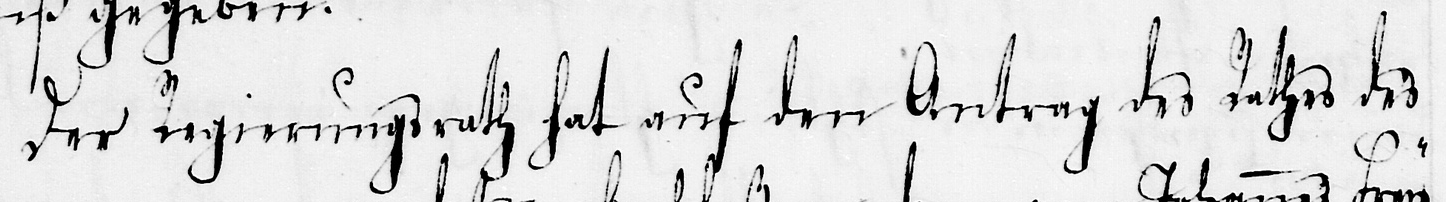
Der Regierungsrath hat auf den Antrag des Rathes des
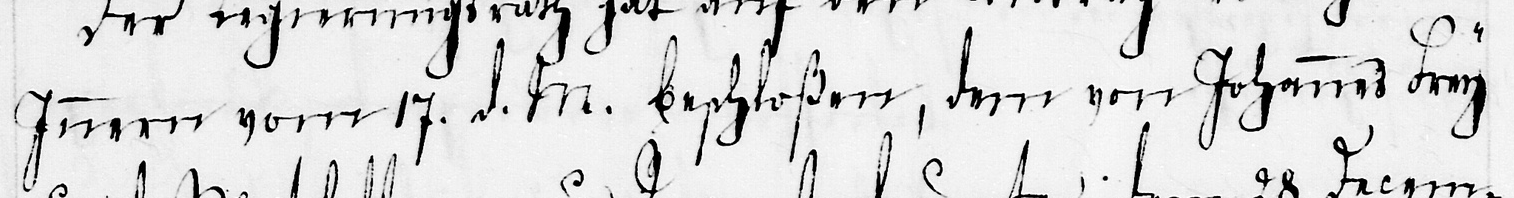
Innern vom 17. d. M. beschloßen, dem von Johannes Frey
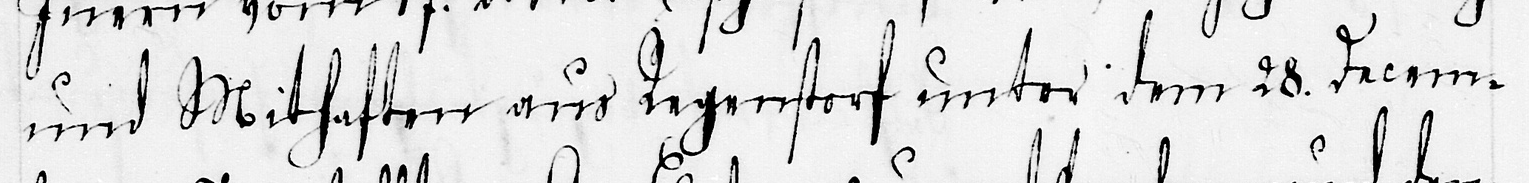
und Mithaften aus Regenstorf unter dem 28. Decem¬
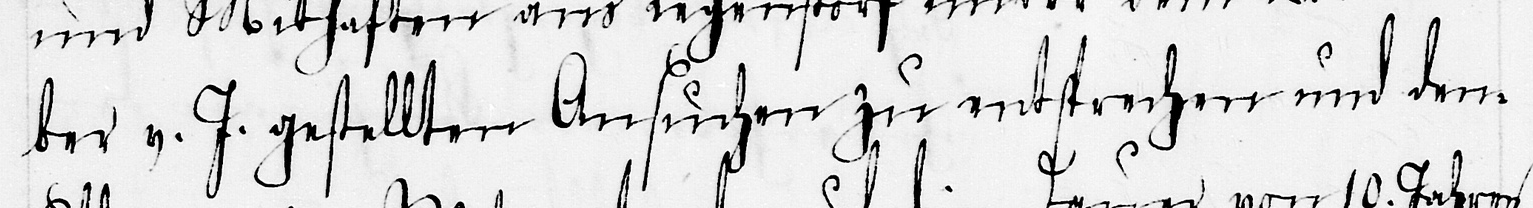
ber v. J. gestellten Ansuchen zu entsprechen und den¬
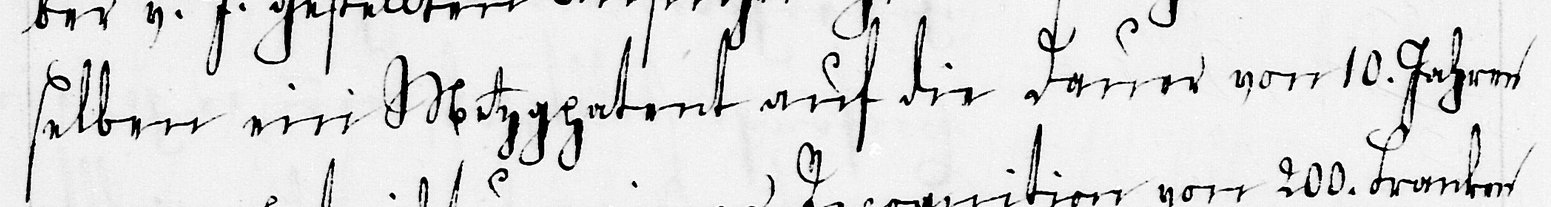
selben ein Metzgpatent auf die Dauer von 10. Jahren
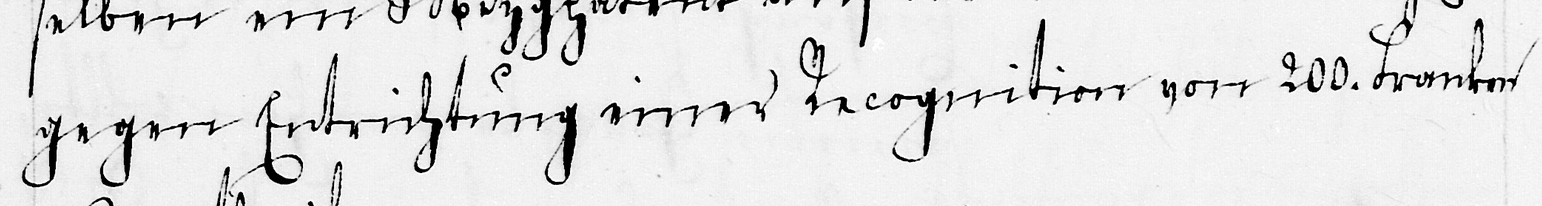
gegen Entrichtung einer Recognition von 200. Franken
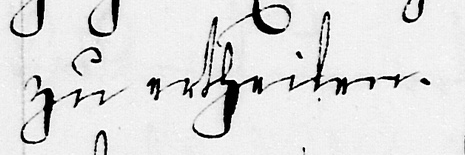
zu ertheilen.
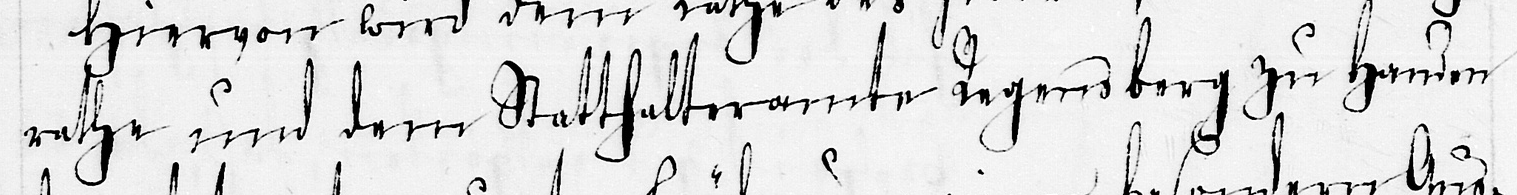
rathe und dem Statthalteramte Regensberg zu Handen
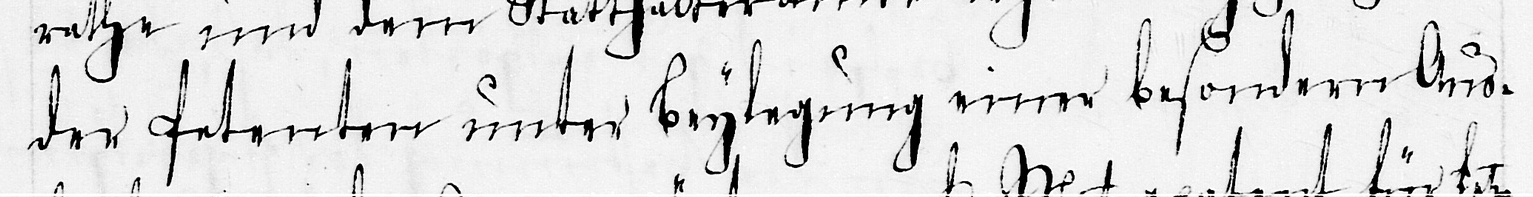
der Petenten unter Beylegung einer besondern Aus¬
